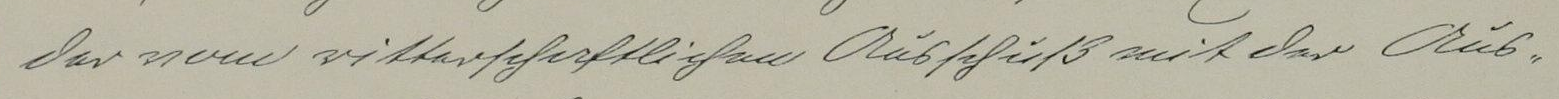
der vom ritterschaftlichen Ausschuß mit der Aus-
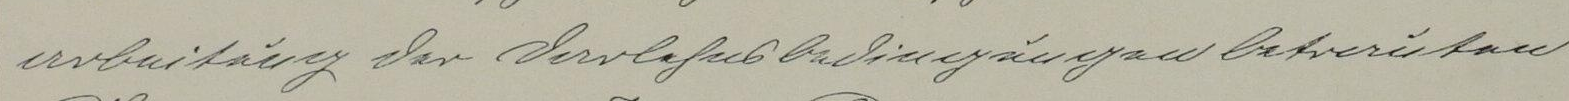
arbeitung der Darlehnsbedingungen betrauten
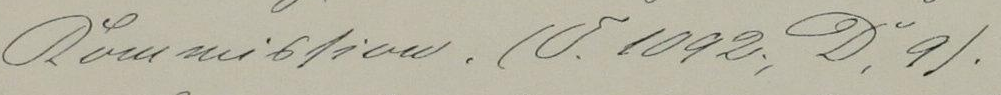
Kommission (T.1092; D.9).
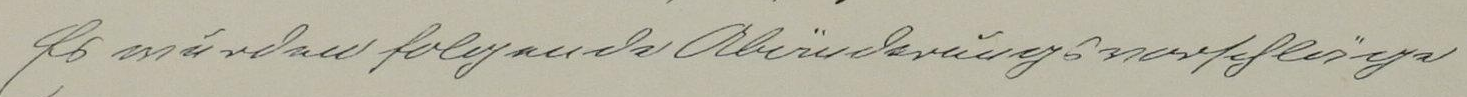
Es wurden folgende Abänderungsvorschläge
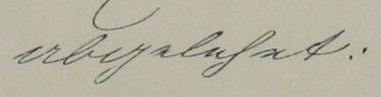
abgelehnt:
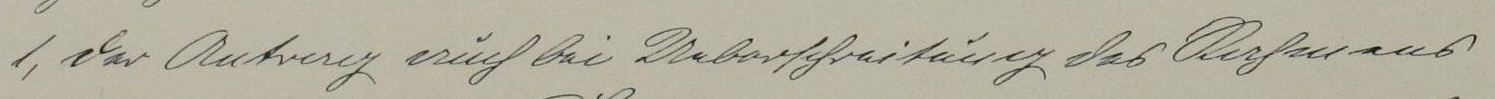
1. der Antrag auch bei Ueberschreitung des Rahmens
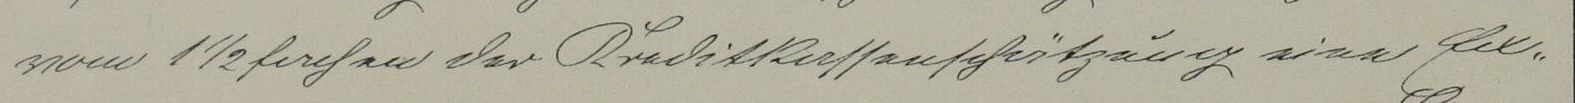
vom 1½-fachen der Kreditkassenschätzung eine Ex-
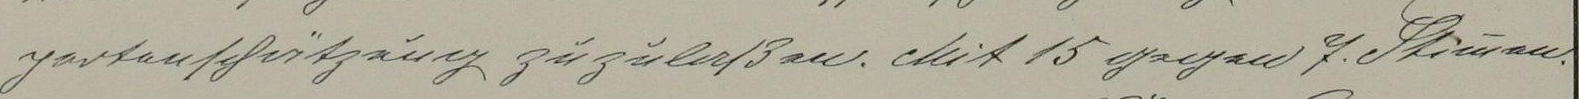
pertenschätzung zuzulaßen. Mit 15 gegen 7 Stimmen.
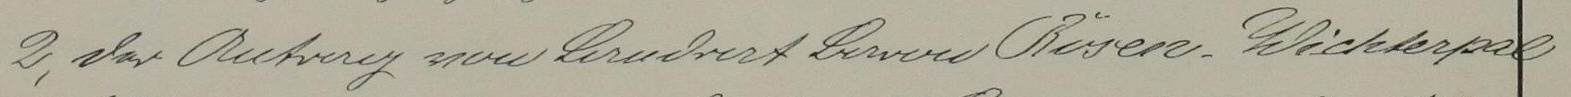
2. der Antrag von Landrat Baron Rosen-Wichterpal
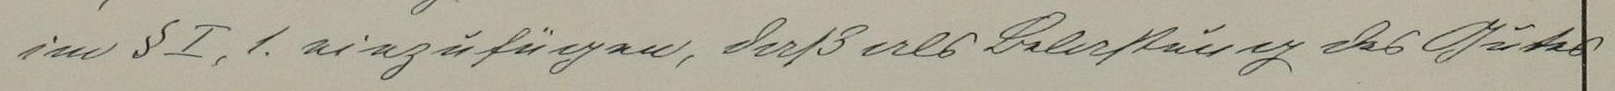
im § I,1 einzufügen, daß als Belastung des Gutes
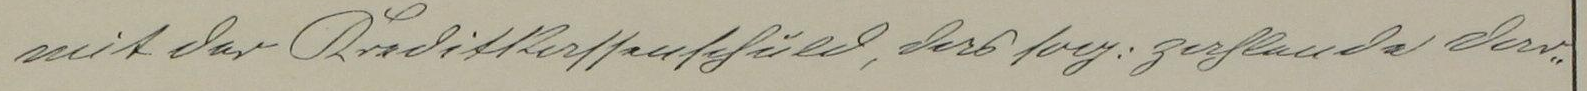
mit der Kreditkassenschuld, das sog. zahlende Dar-
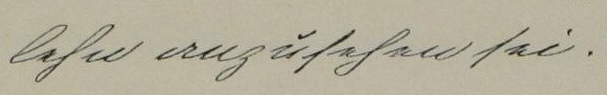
lehn anzusehen sei.
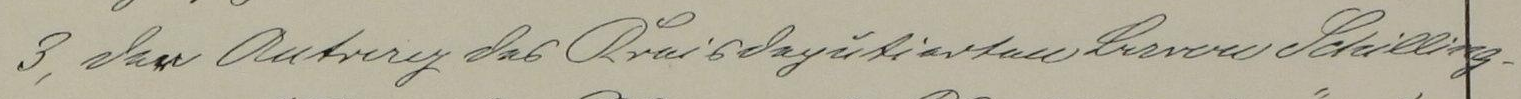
3. der Antrag des Kreisdeputierten Baron Schilling-
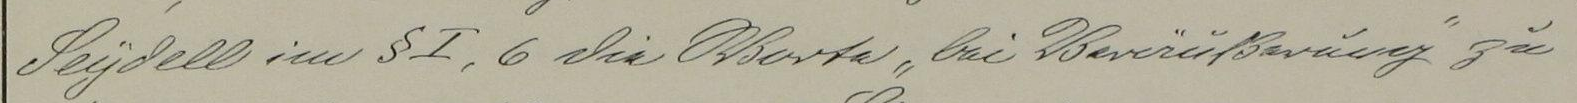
Seydell, im § I,6 die Worte „bei Veräußerung“ zu
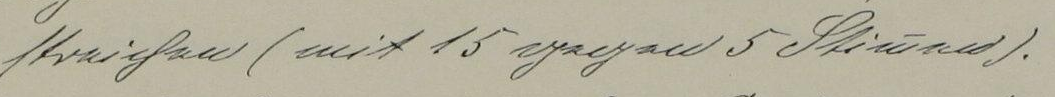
streichen (mit 15 gegen 5 Stimmen).
